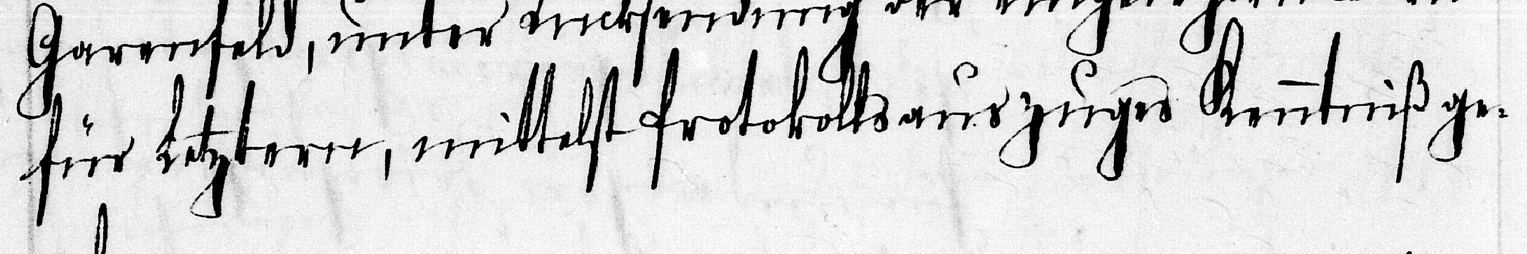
für Letztern, mittelst Protokollsauszuges Kenntniß ge¬
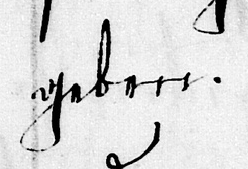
geben.
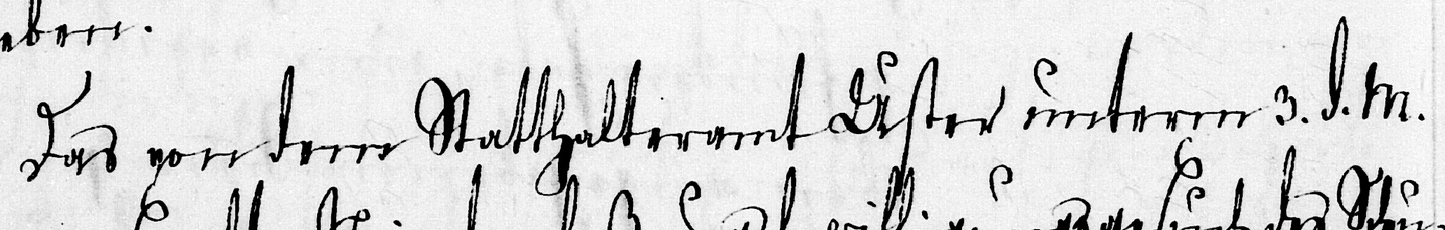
Das von dem Statthalteramt Uster unterm 3. d. M.
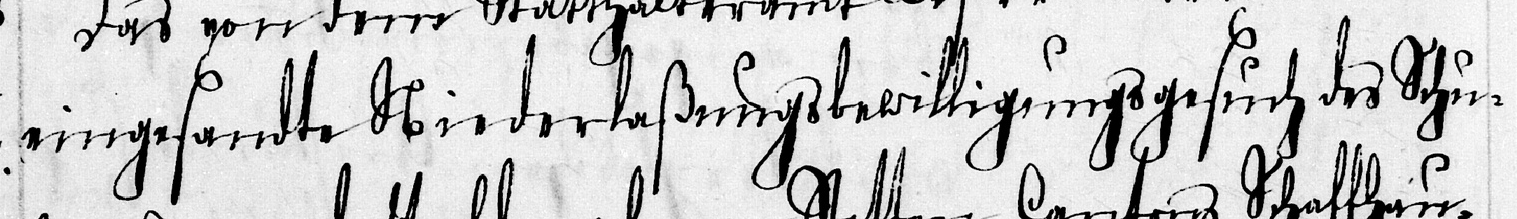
eingesandte Niederlaßungsbewilligungsgesuch des Schu¬
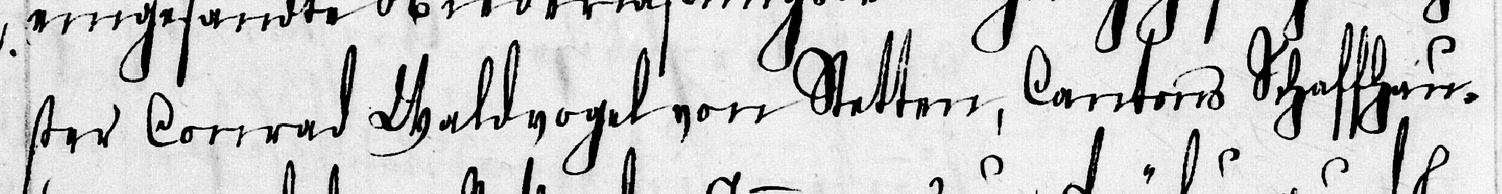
ster Conrad Waldvogel von Stetten, Cantons Schaffhau¬
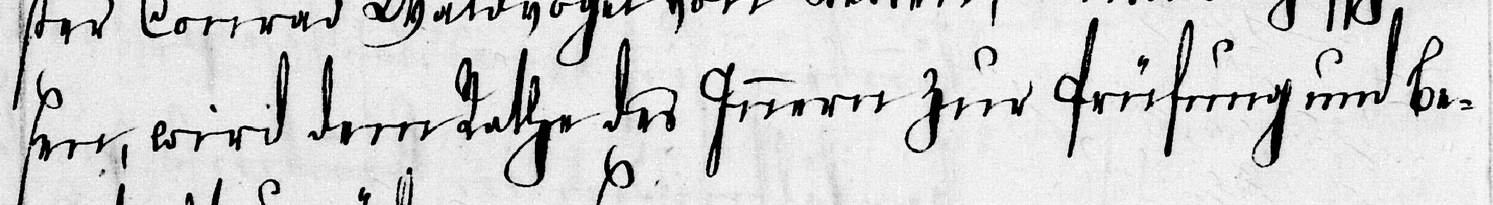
sen, wird dem Rathe des Innern zur Prüfung und Be¬
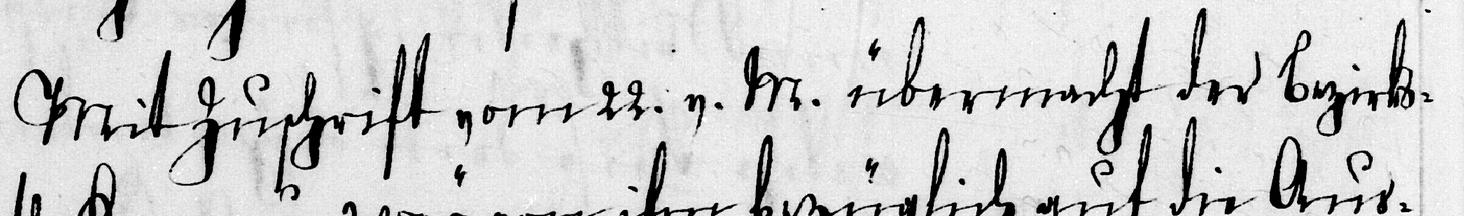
Mit Zuschrift vom 22. v. M. übermacht der Bezirks¬
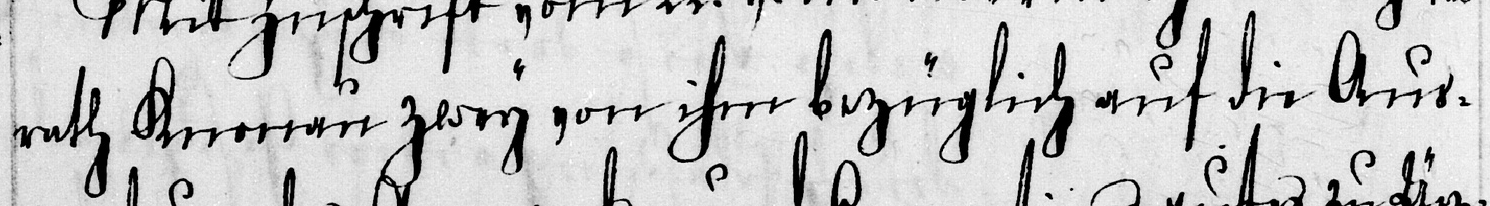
rath Knonau zwey von ihm bezüglich auf die Aus¬
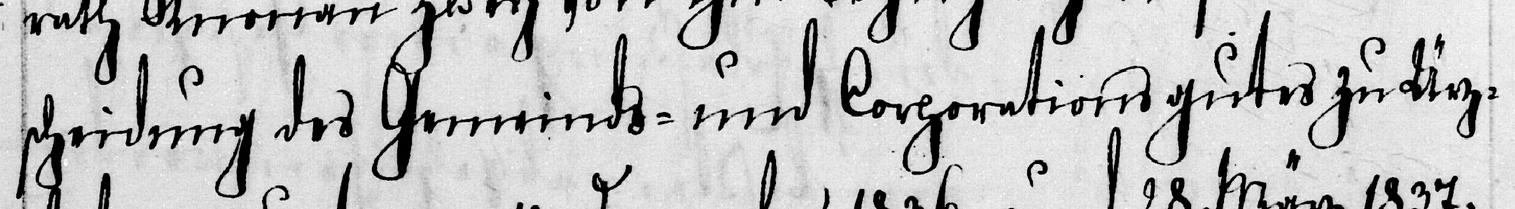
scheidung des Gemeinds- und Corporationsgutes zu Ürz¬
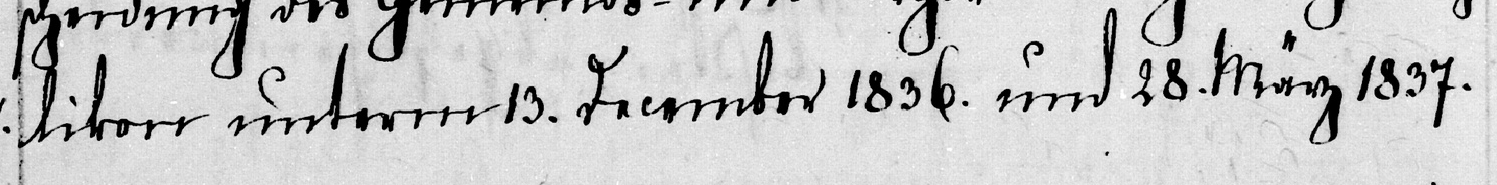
likon unterm 13. December 1836. und 28. März 1837.
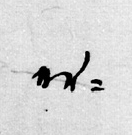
e.
